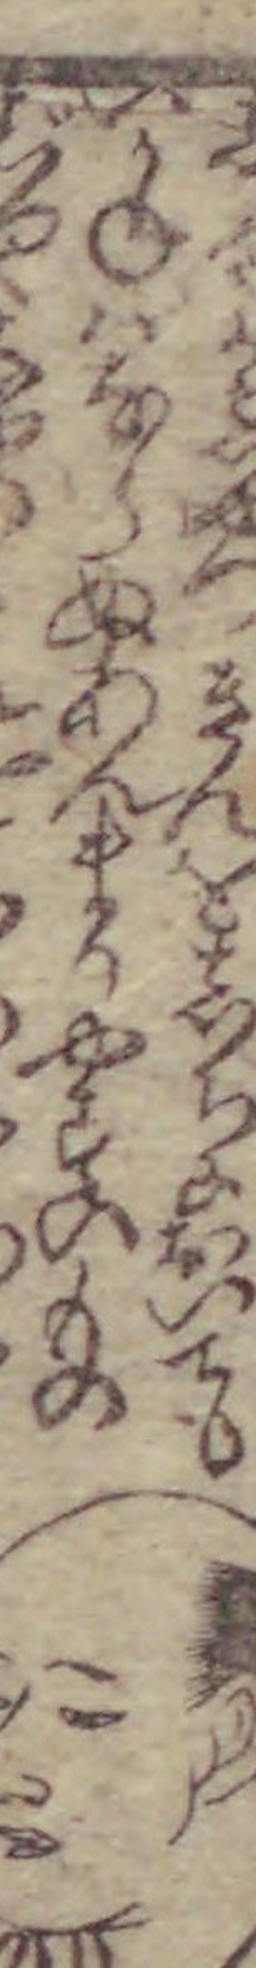いかねはならぬあんまりやすいもの
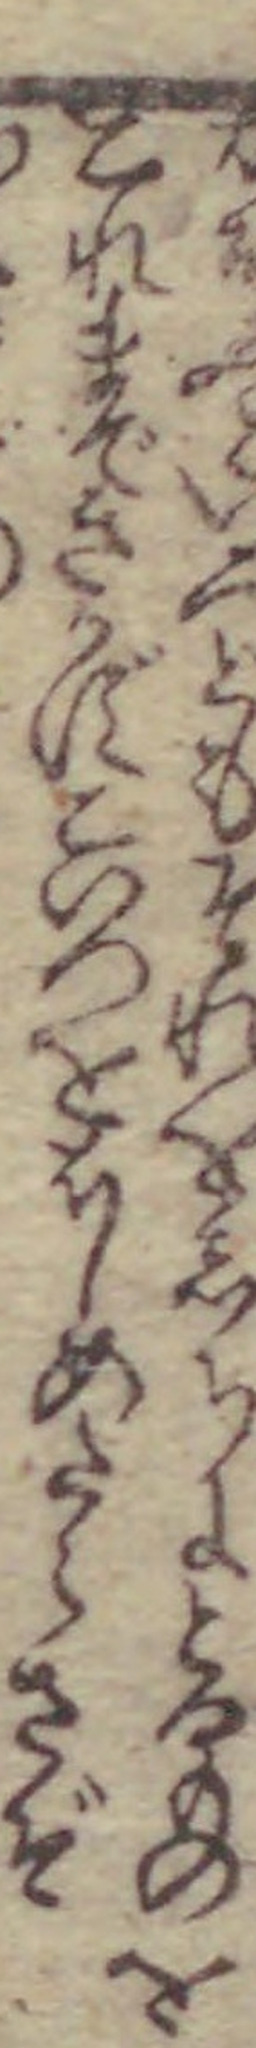これまできかずこいつをはじめたらさぞ
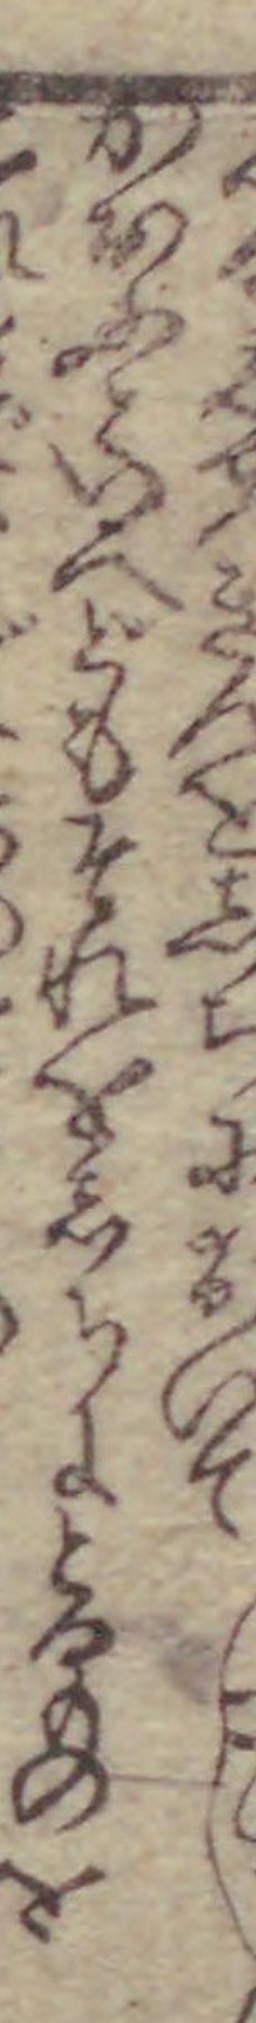かおふといへどもそれをしちにとるものを
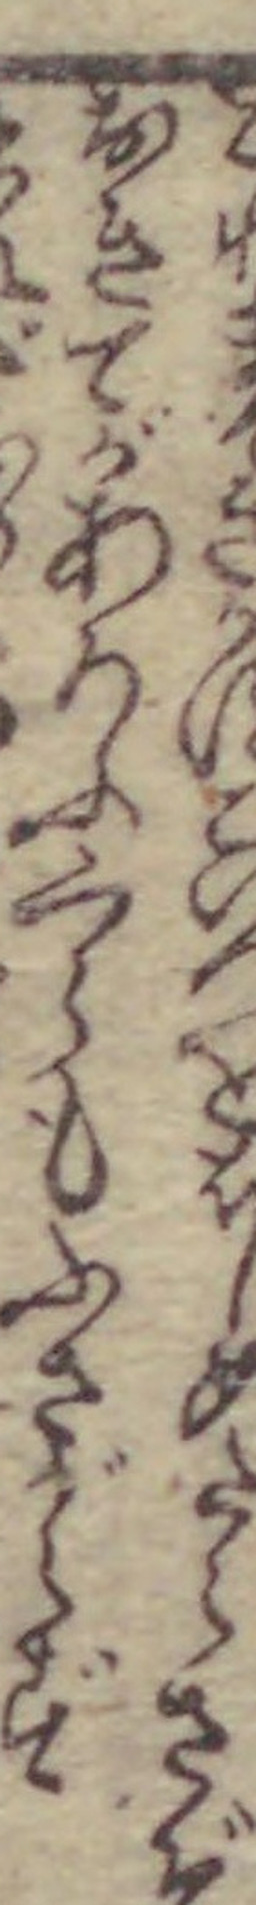おきてがあろふくらもふさがらず
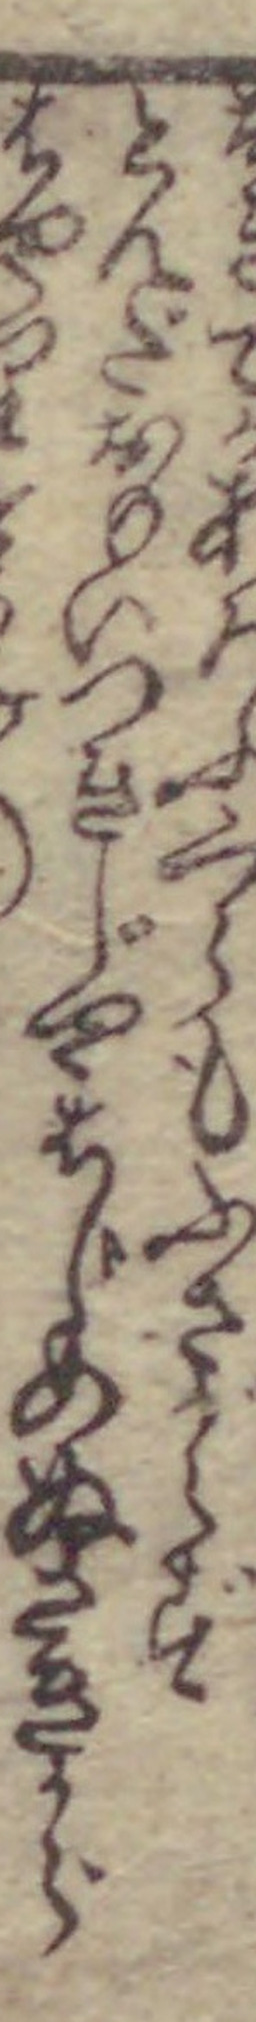とんだおもいつきじやはじめぬさきから
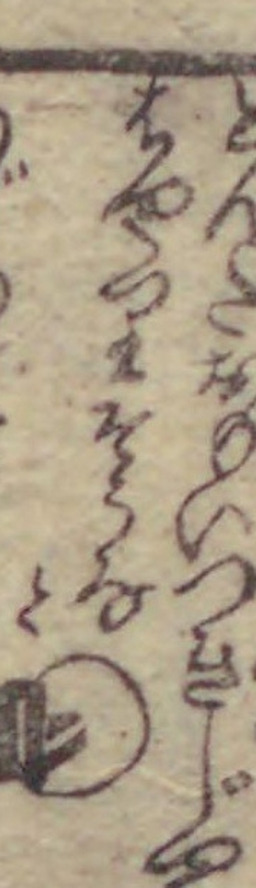はやりそうな
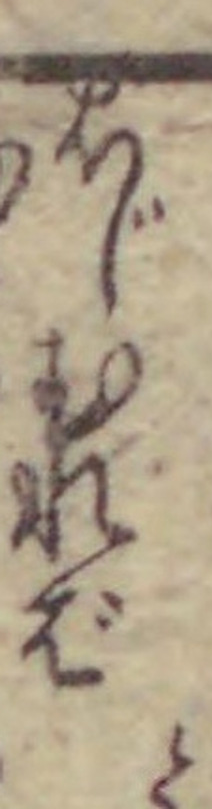はじむれば
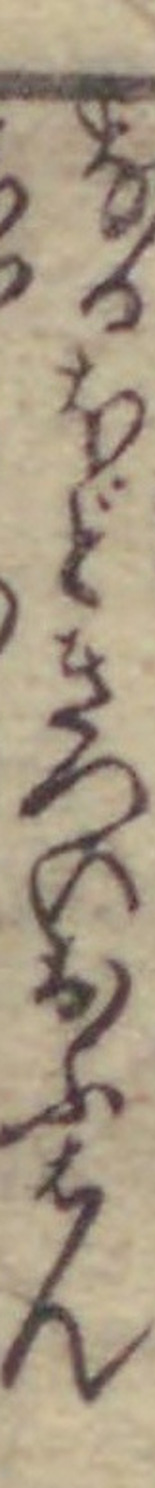なるほどきついおふはん
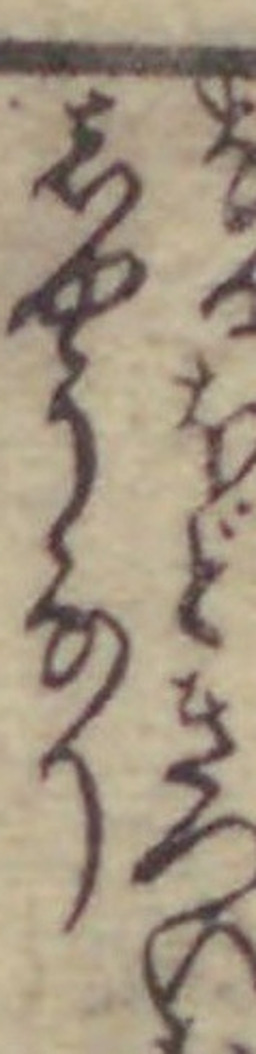しやうなり
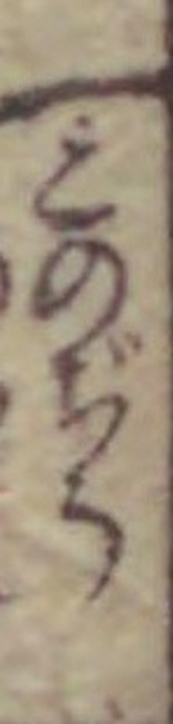このぢう
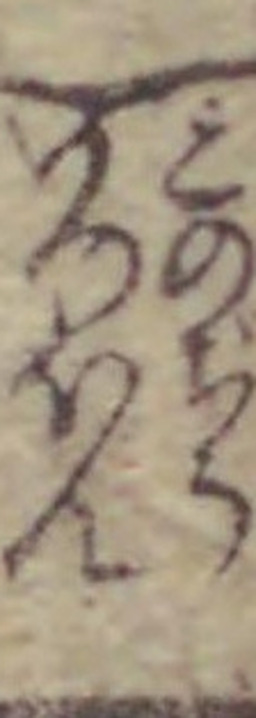いつほん
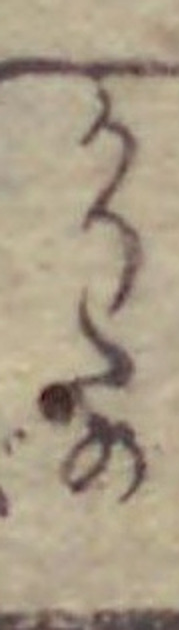かりたの
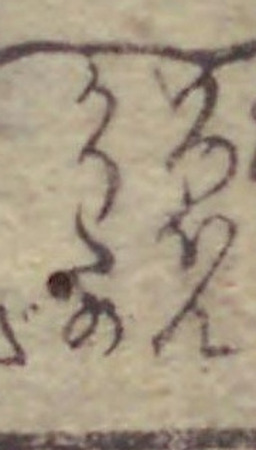かりたの
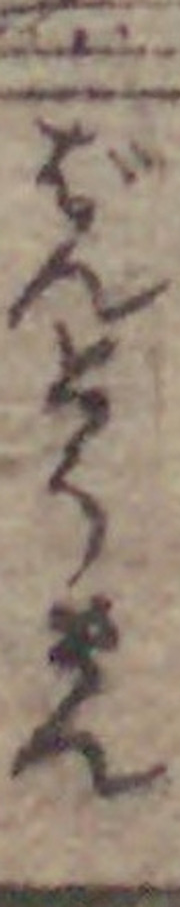ばんとうさん
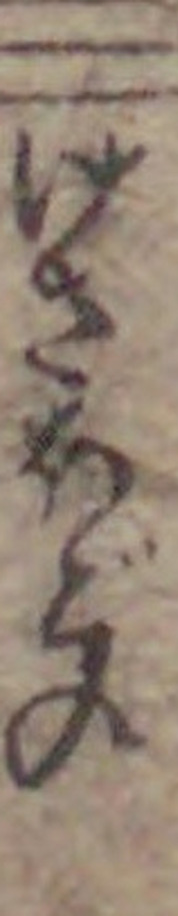けさほどの

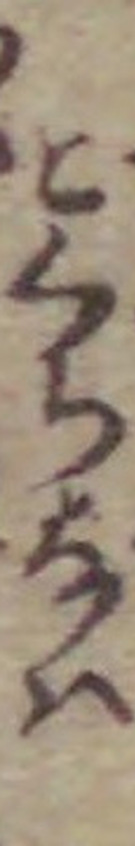こくちなは
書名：御代の御寶
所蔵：国立国会図書館 National Diet Library, JAPAN
